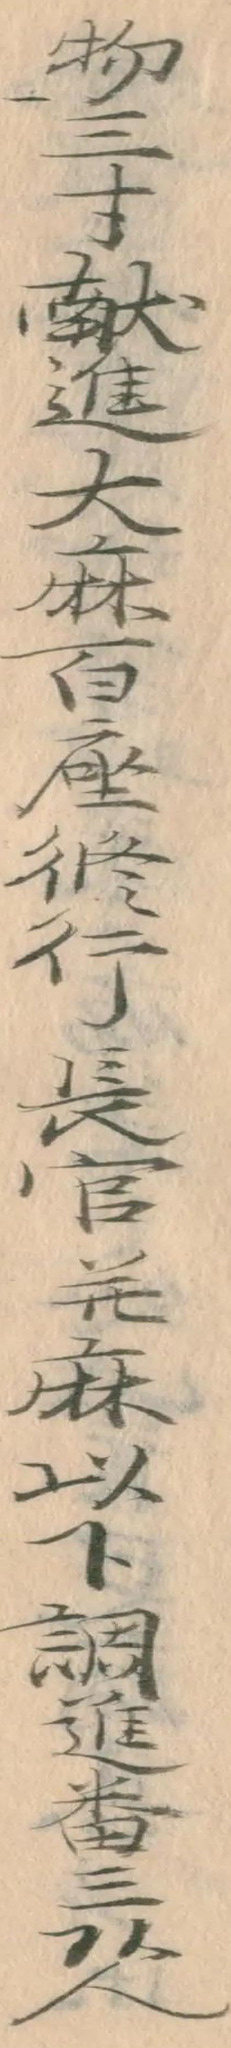物三寸献進大麻百座修行長官并麻以下調進番三頭人
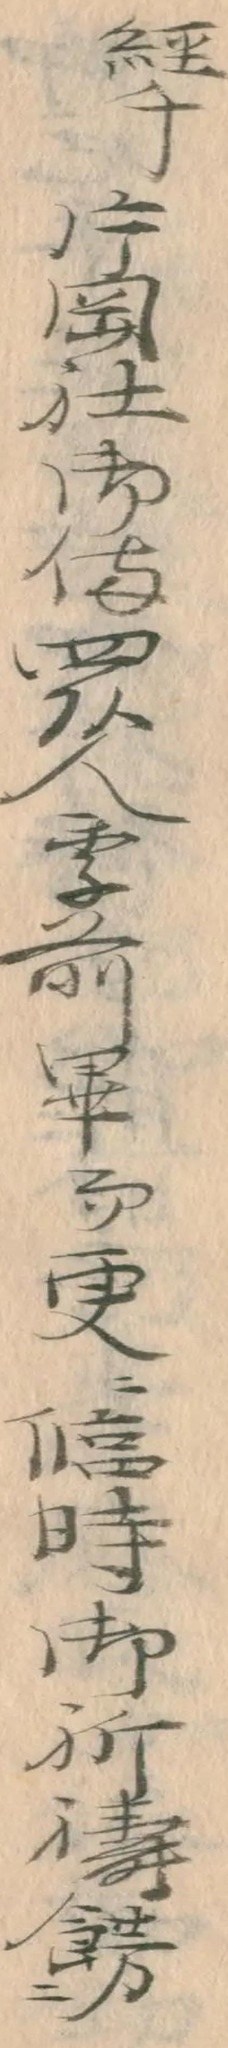経千片岡社御備四頭人季前畢而更ニ臨時御祈祷餝
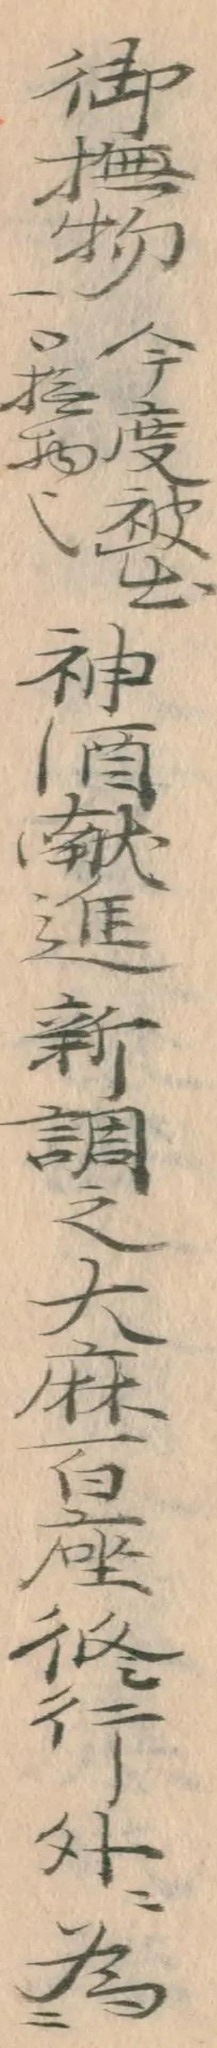御撫物今度被出御撫物也神酒献進新調之大麻百座修行外ニ為
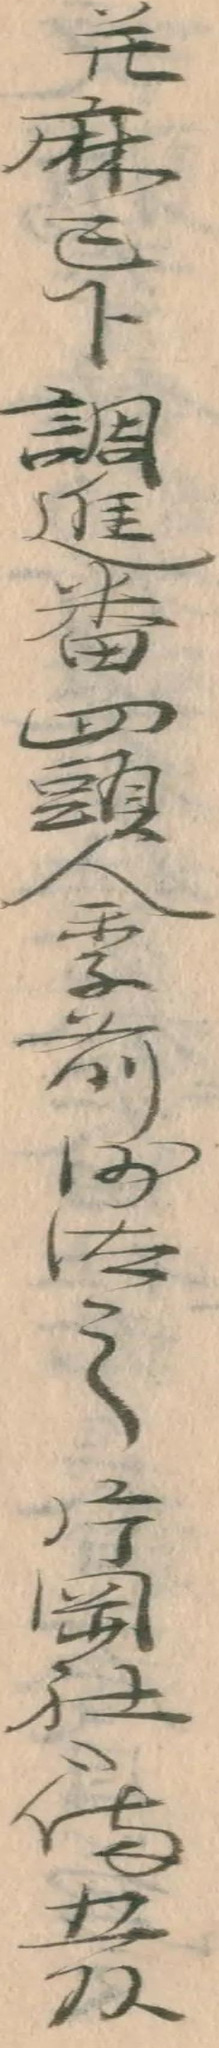幷麻已下調進番四頭人季前沙汰之片岡社御備五頭
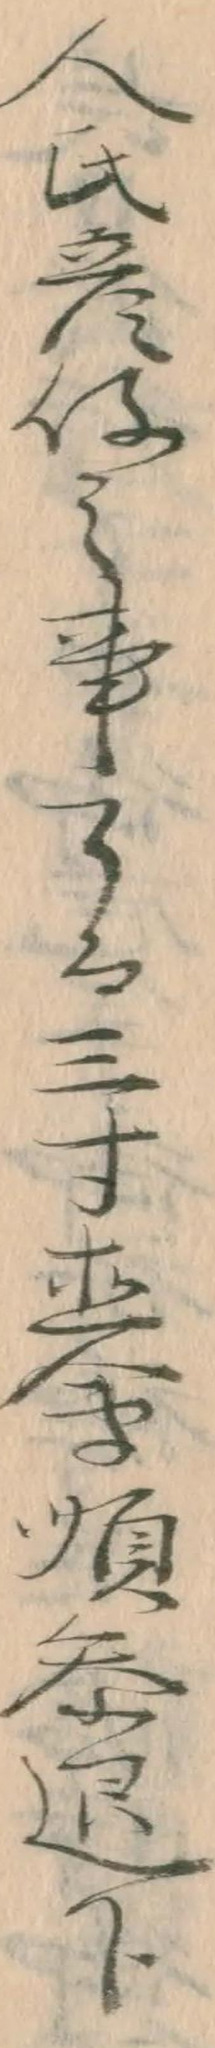人氏彦役之事了而三寸直會順参退下
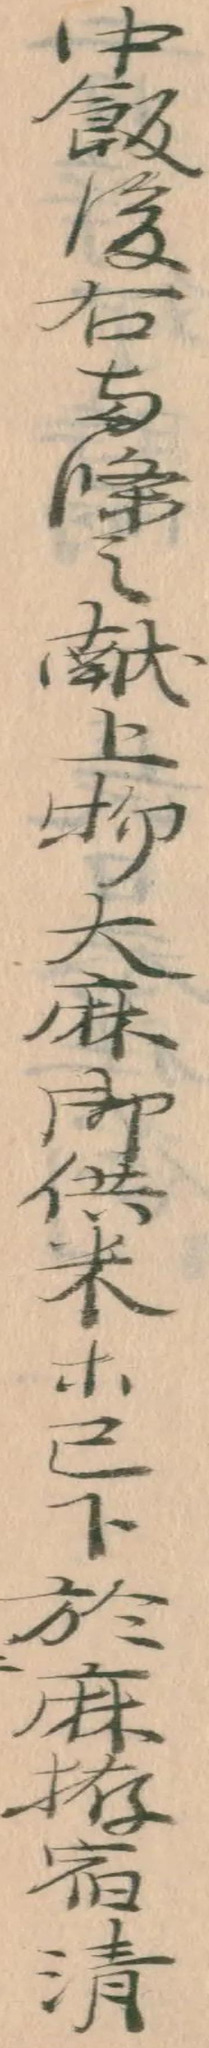中飯後右南鐐之献上物大麻御供米等已下於麻拵宿清
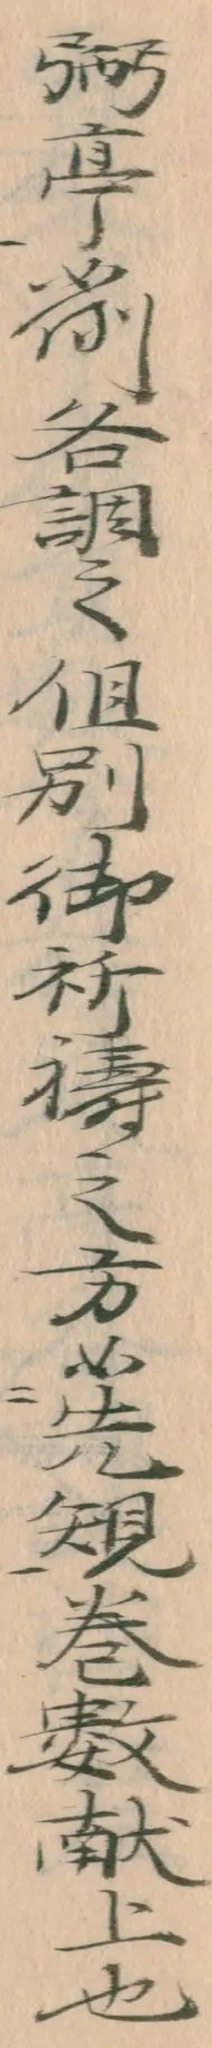弼亭如例各調之但別御祈祷之方如先規巻数献上也
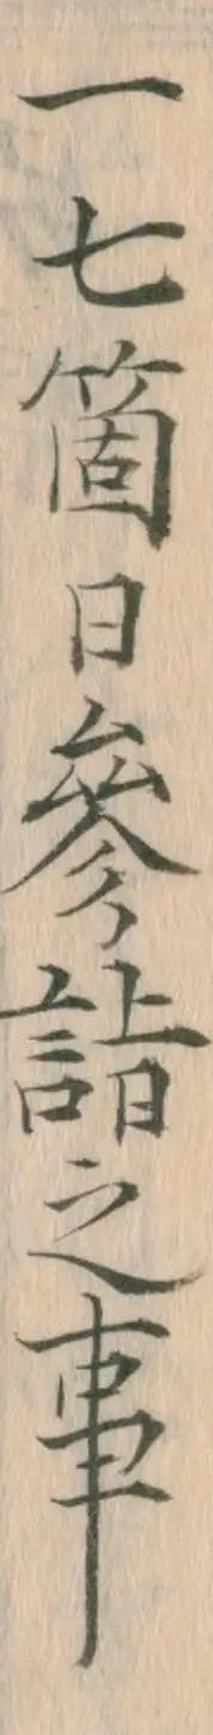一七箇日参詣之事
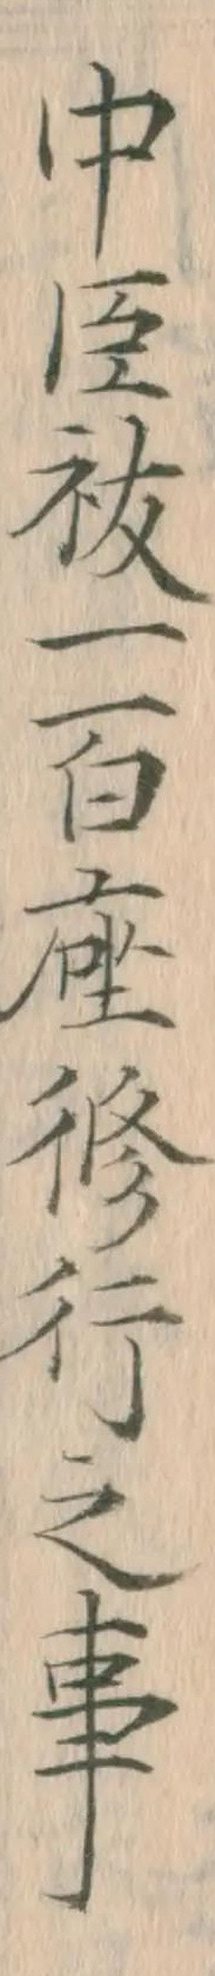中臣秡一百座修行之事
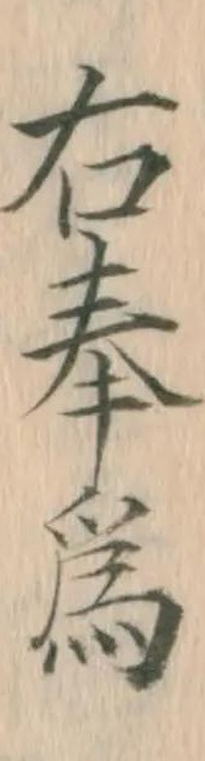右奉為
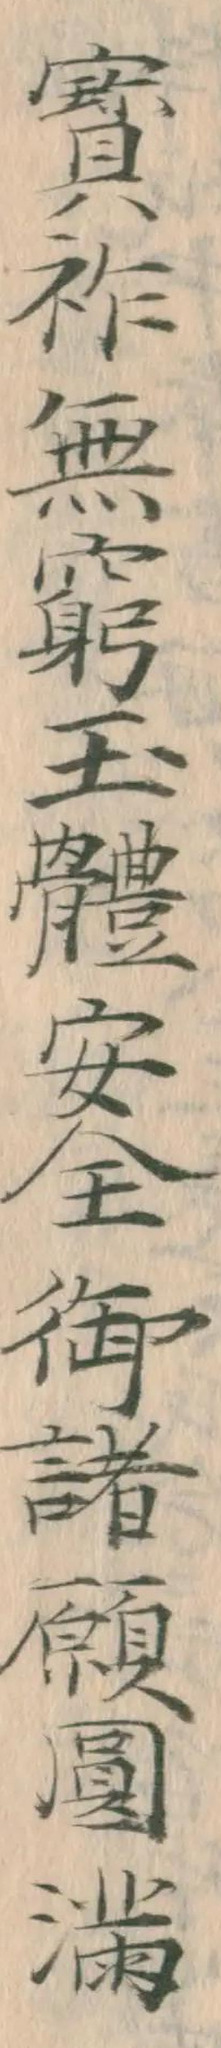寶祚無窮玉體安全御諸願圓滿
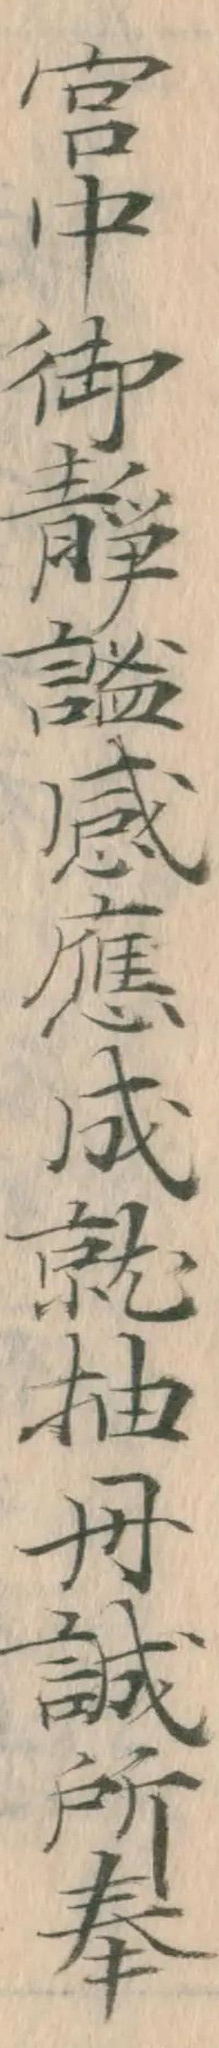宮中御静謐感應成就抽丹誠所奉
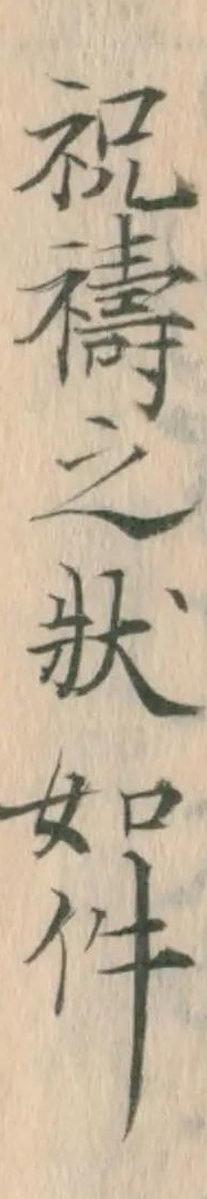祝禱祷之状如件

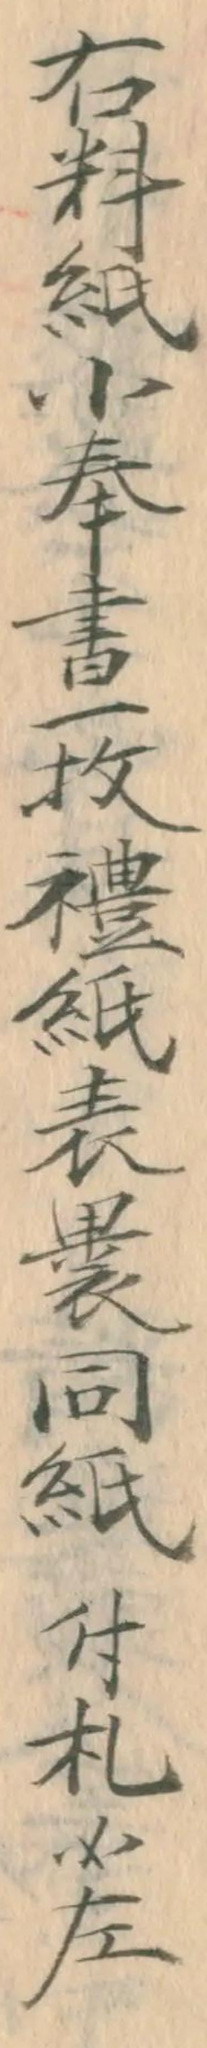右料紙小奉書一枚禮紙表褁同紙付札如左
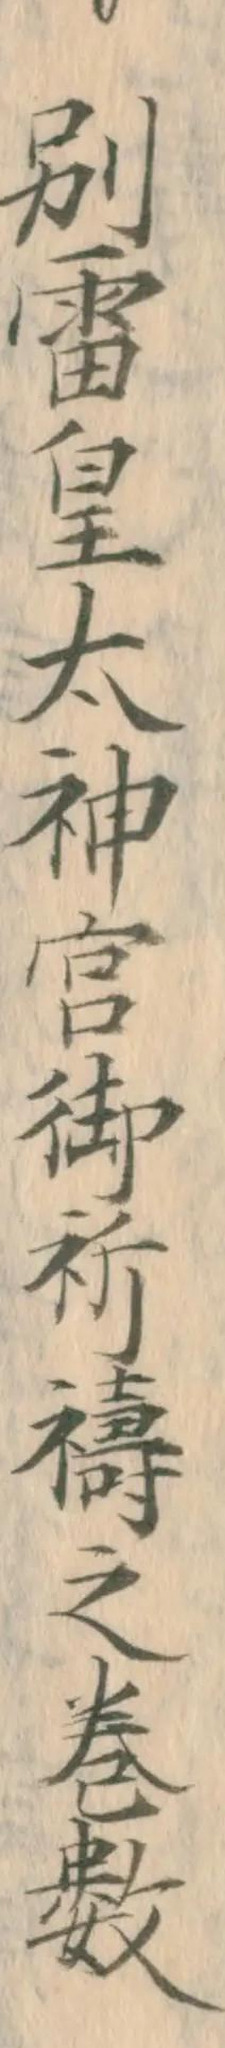別雷皇太神宮御祈祷之巻数
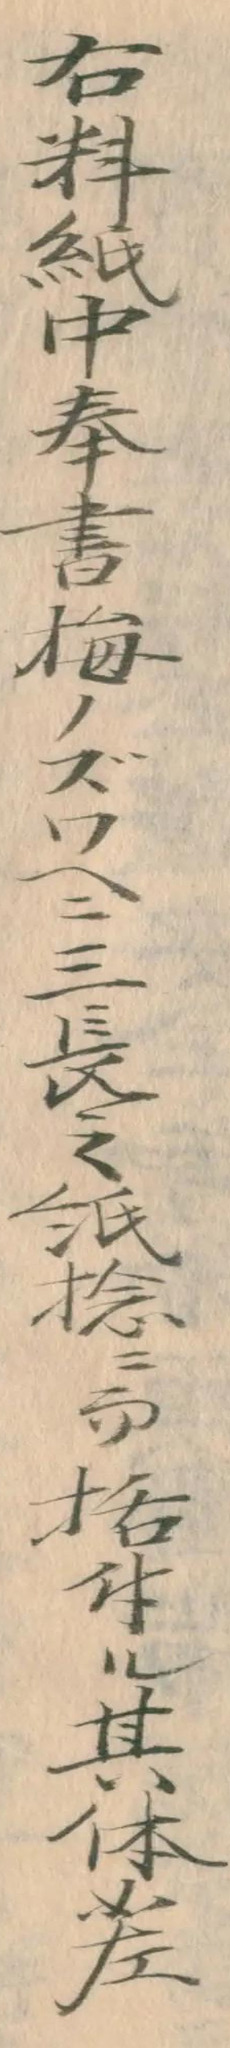右料紙中奉書梅ノズワヘニ三長之紙捻ニ而括付ル其体如左
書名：賀茂社記録. 第74冊
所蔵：国立国会図書館 National Diet Library, JAPAN
